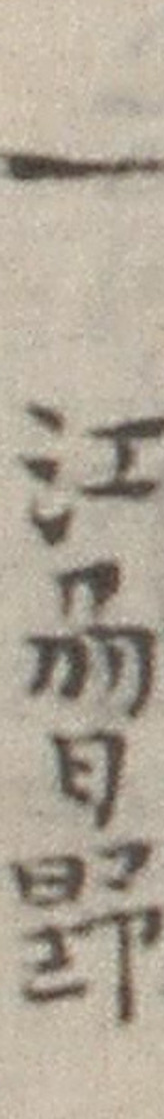同江州日野
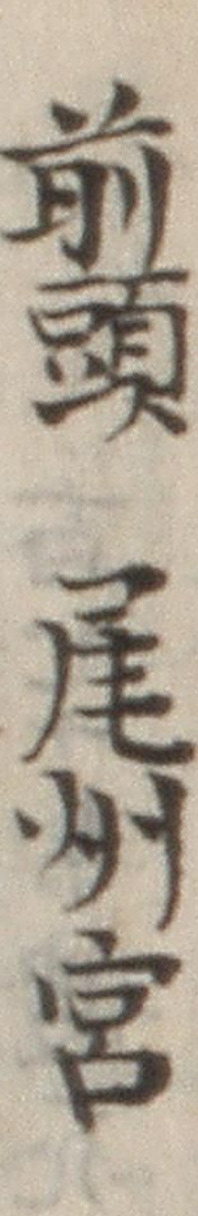前頭尾州宮
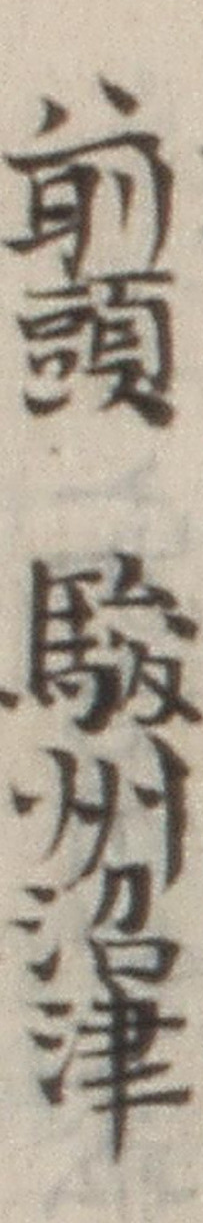前頭駿州沼津
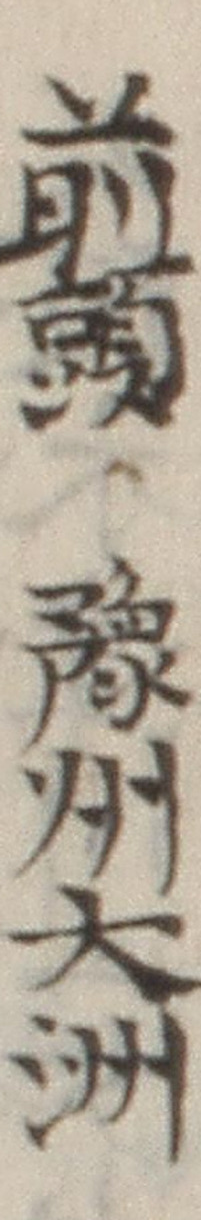前頭豫州大洲
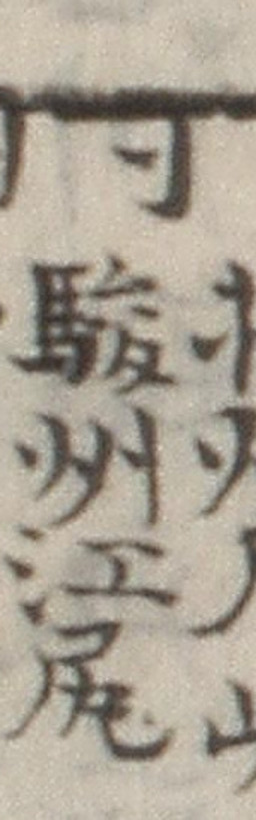同駿州奥津
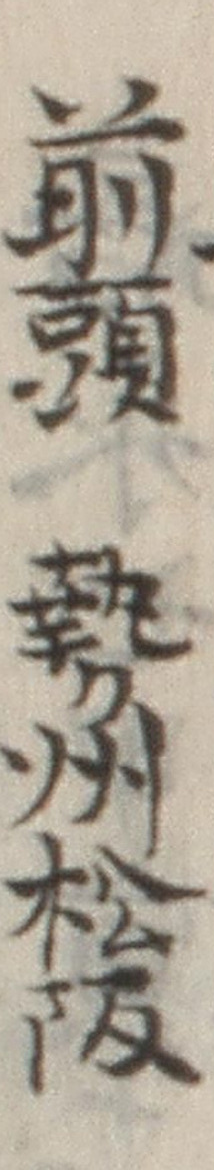前頭勢州松阪
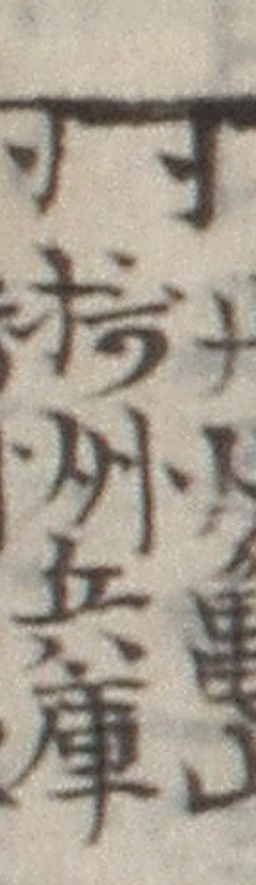同摂州兵庫
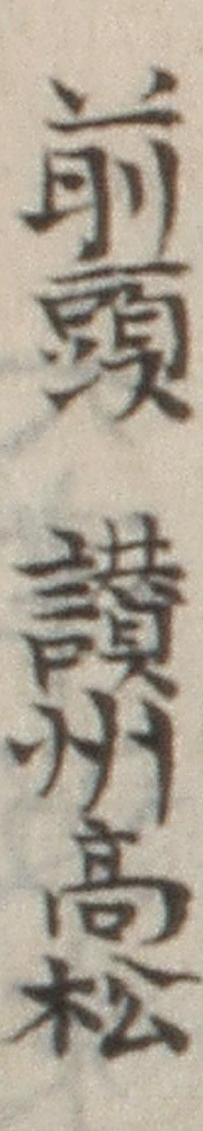前頭讃州高松
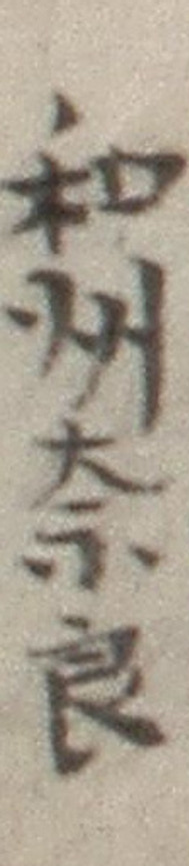和州奈良

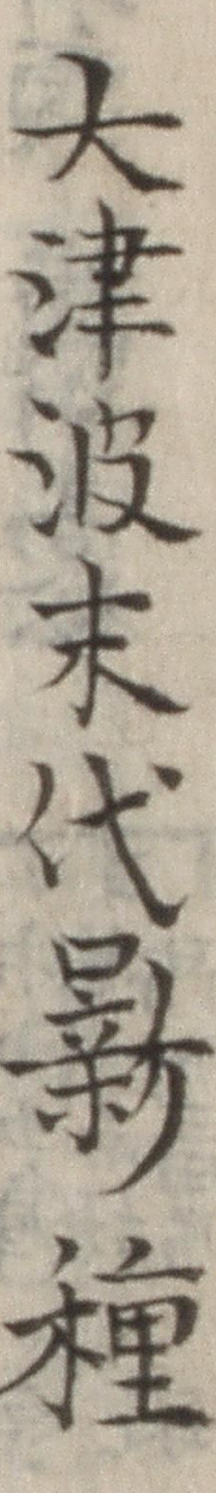大津波末代噺種
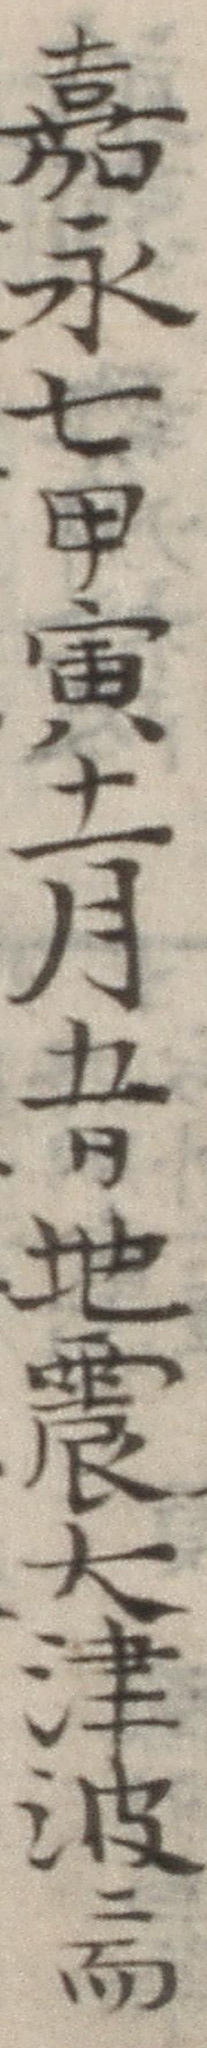嘉永七甲寅十一月五日地震大津波ニ而
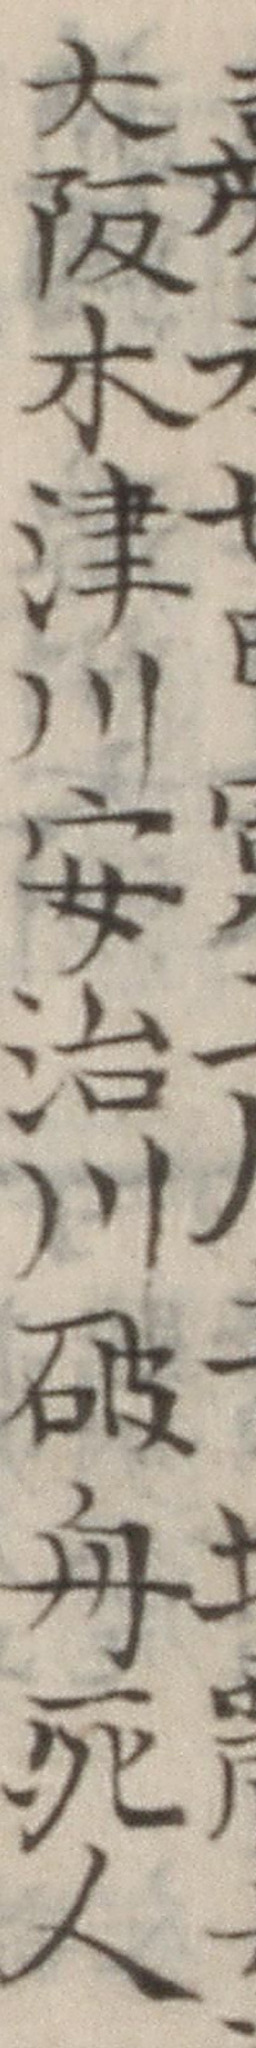大阪木津川安治川破舟死人
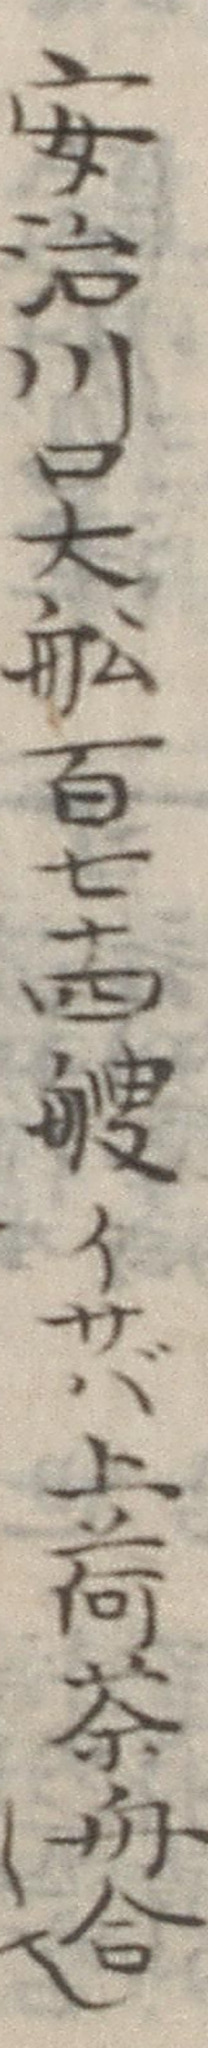安治川口大船百七十四艘イサバ上荷茶舟合して
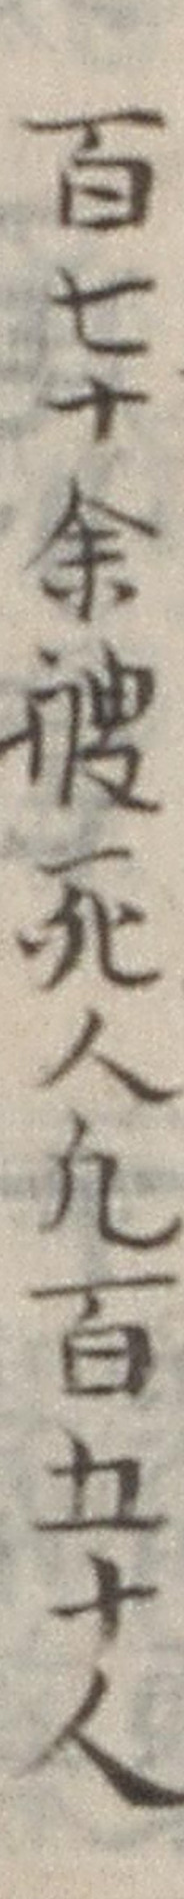百七十余艘死人凡百五十人
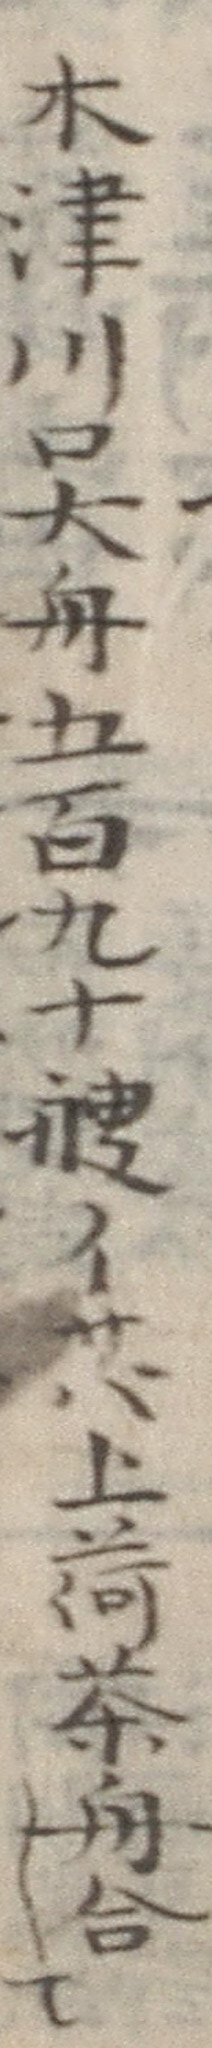木津川口大舟五百九十艘イサバ上荷茶舟合して
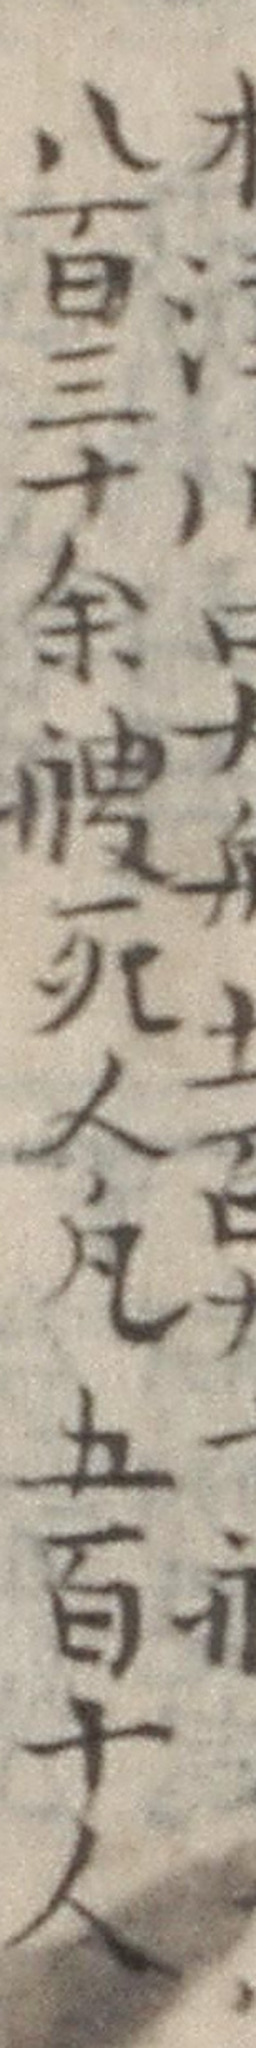八百三十余艘死人凡五百十人
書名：諸國大地震年代記末代噺種
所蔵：東京大学地震研究所図書室 Earthquake Research Institute Library, The University of Tokyo, JAPAN
